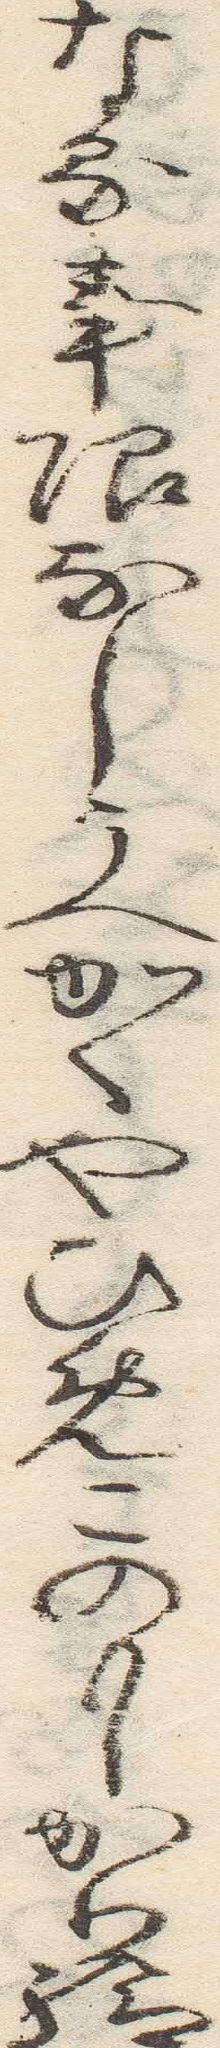なる事限なしうへかくやひめこのもしかり給
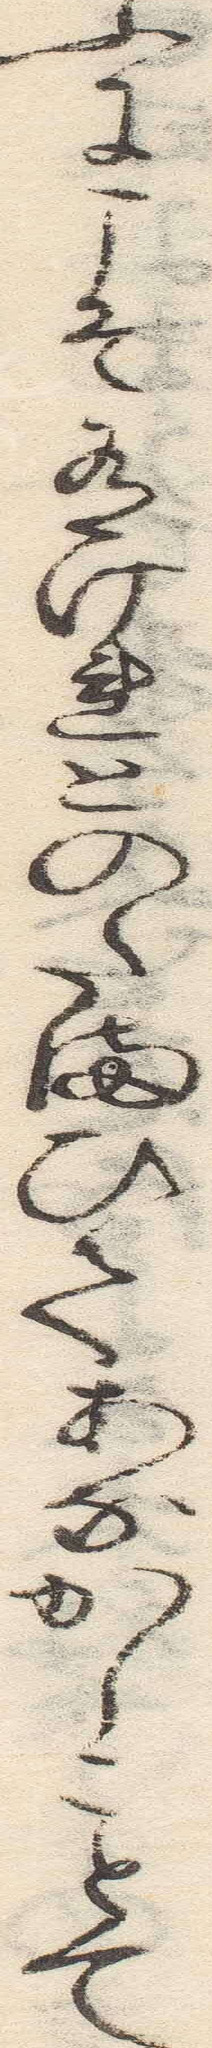ふにこそ有けれとのたまひてあかしことて
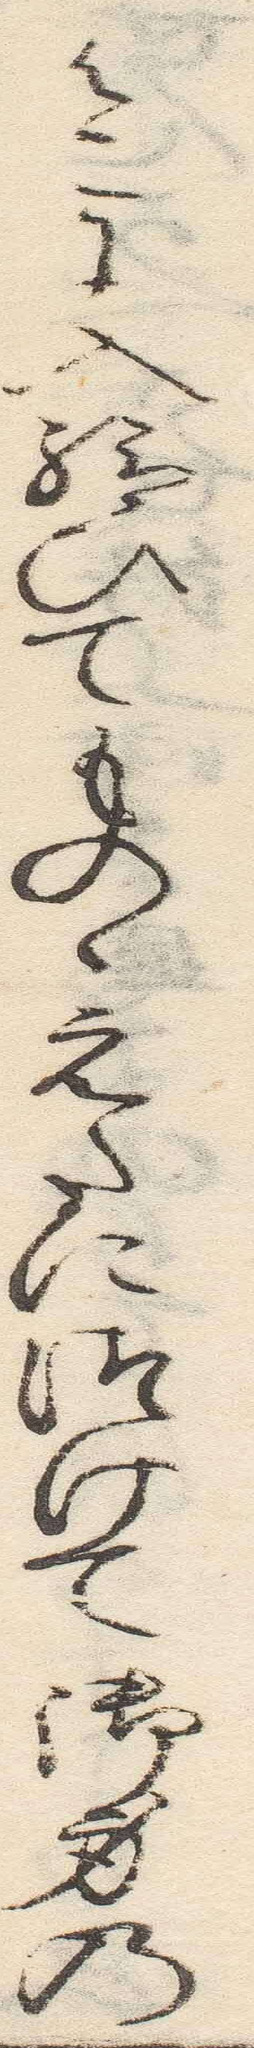はこに入給ひてものゝえたにつけて御身の

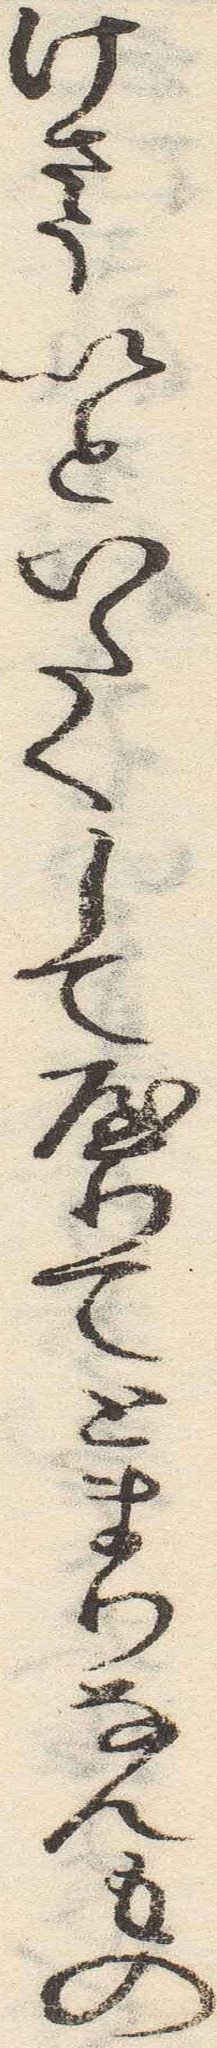けさういといたくしてやりてとまりなんもの
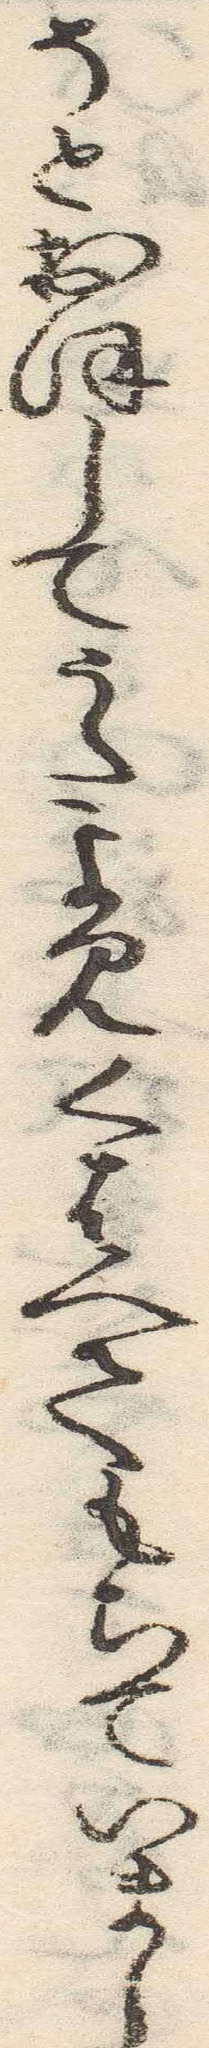そとおほしてうたよみくはへてもちていまし
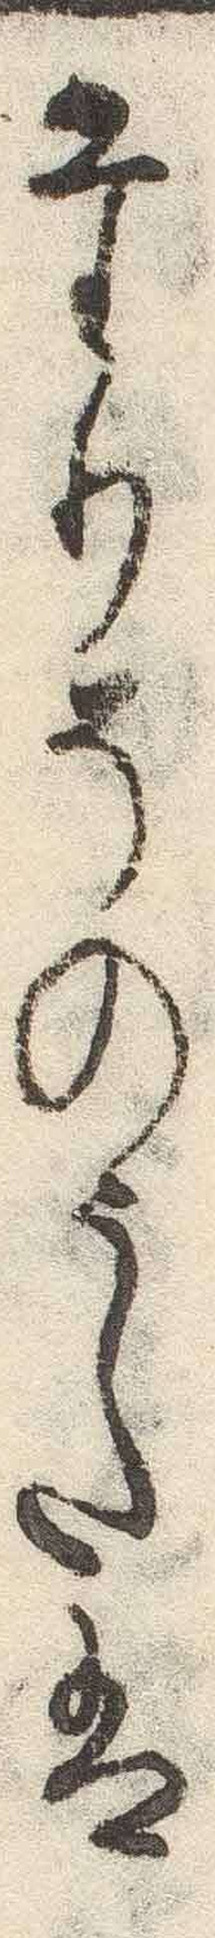たりそのうたは
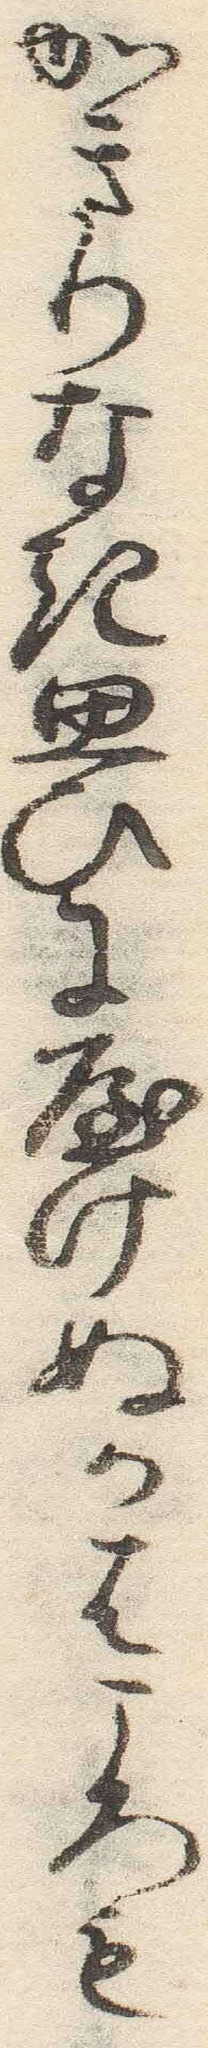かきりなき思ひにやけぬかはころも
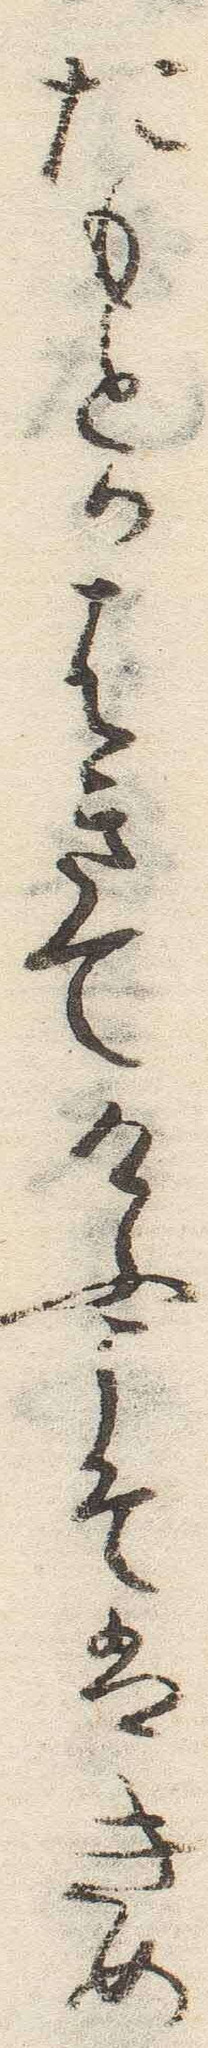たもとかはきてけふこそはきめ
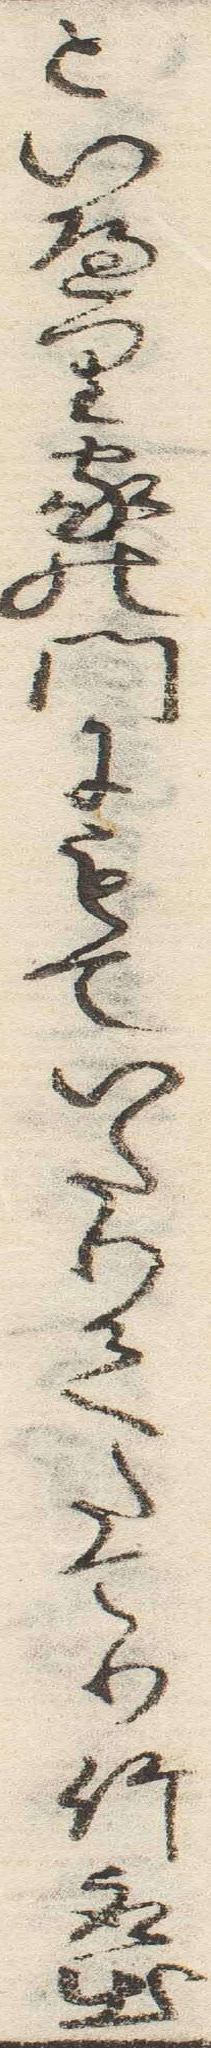といへり家の門にもていたりてたてり竹取出
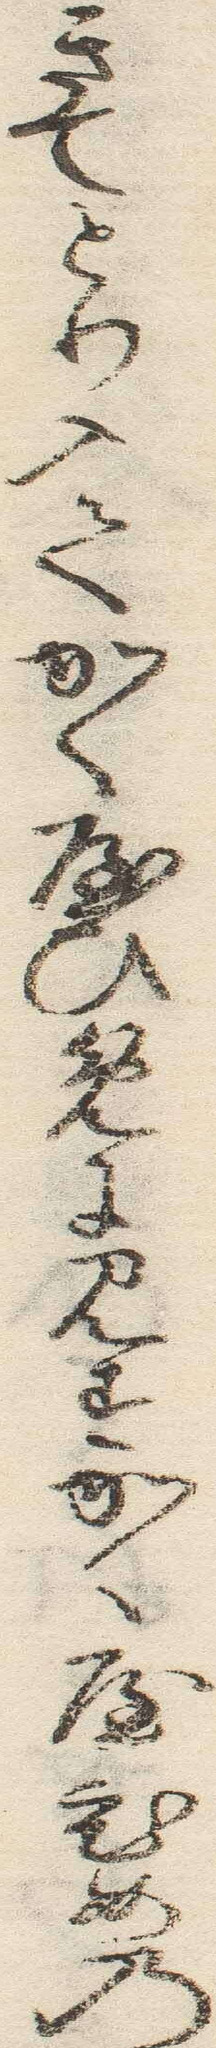きてとり入てかくやひめに見すかくやひめの
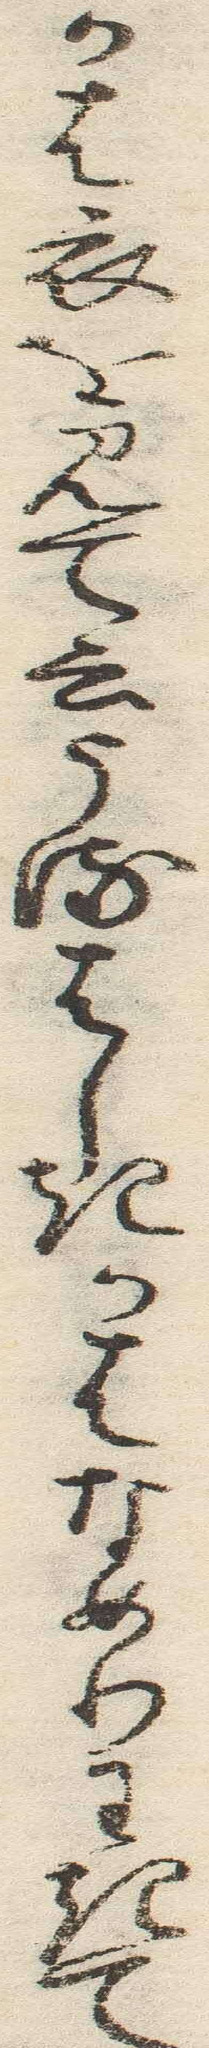かは衣を見て云うるはしきかはなめりわきて
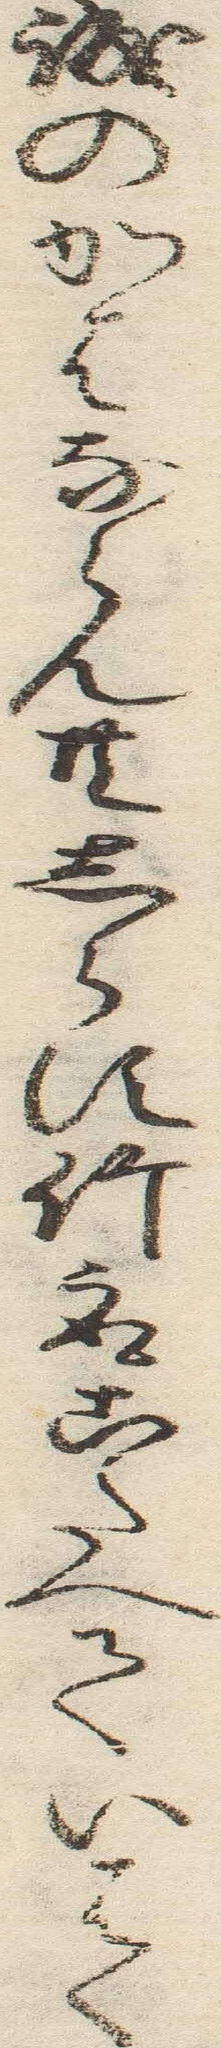誠のかはならん共しらす竹取こたへていはく
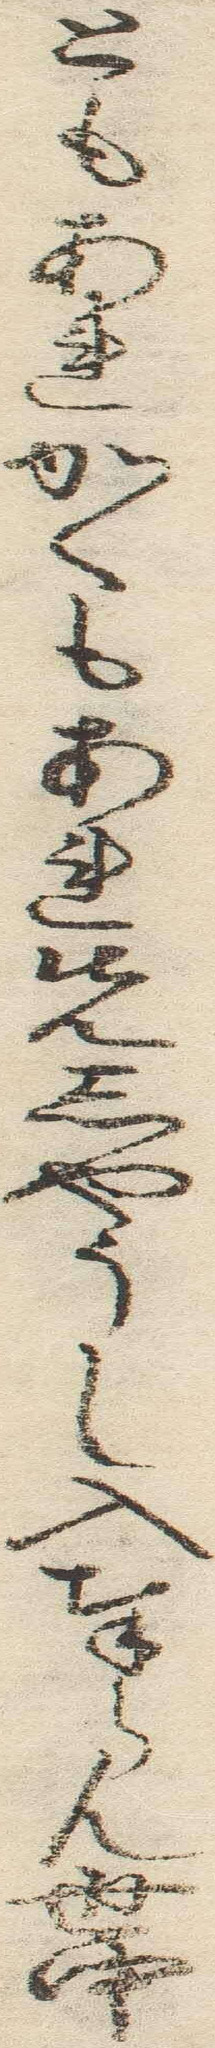ともあれかくもあれ先しやうし入奉らん世中
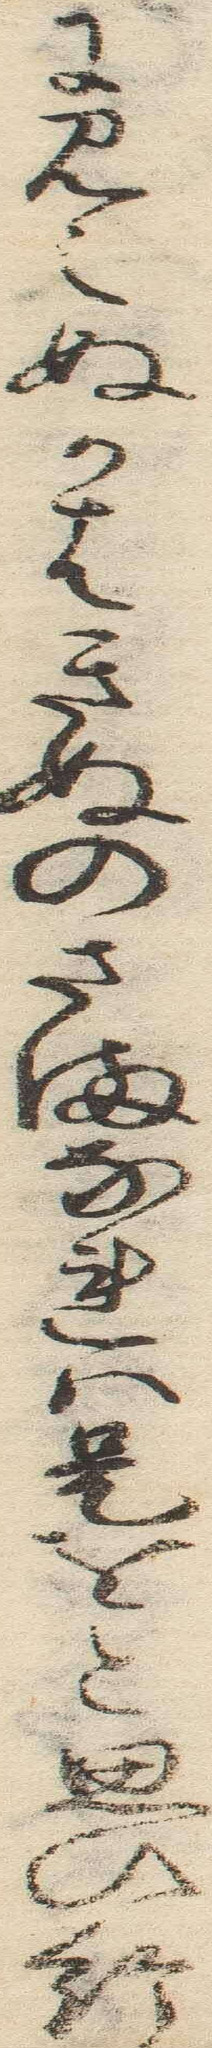に見えぬかはきぬのさまなれは是をと思ひ給

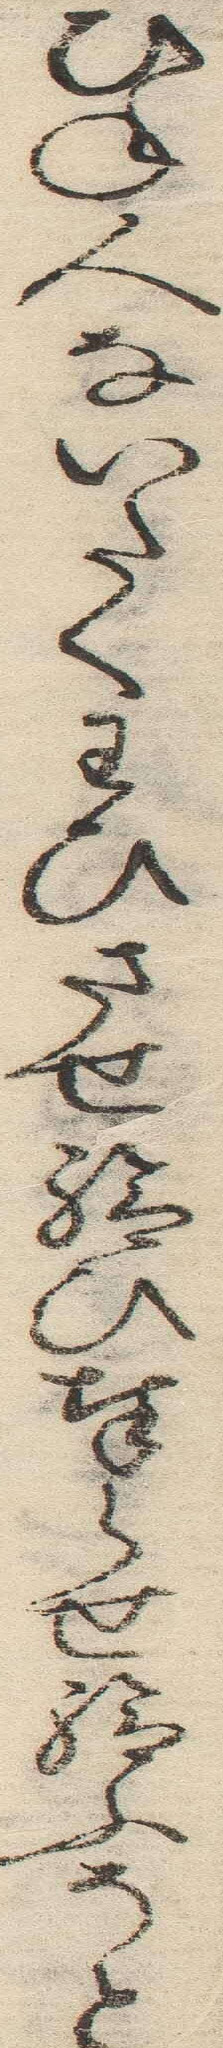ひね人ないたくわひさせ給ひ奉らせ給ふそと
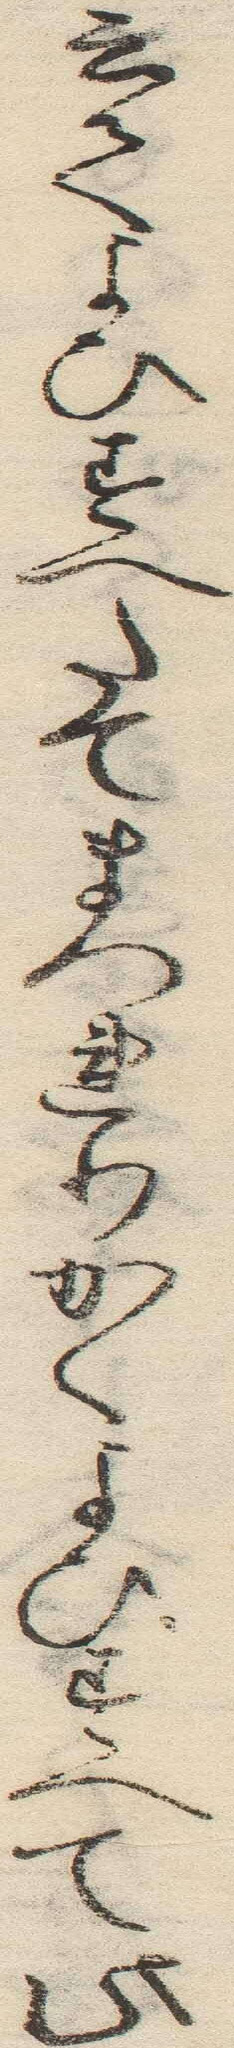云てよひすへたてまつれりかくよひすへて此
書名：竹取物語
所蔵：東京学芸大学附属図書館 国文学研究資料館
